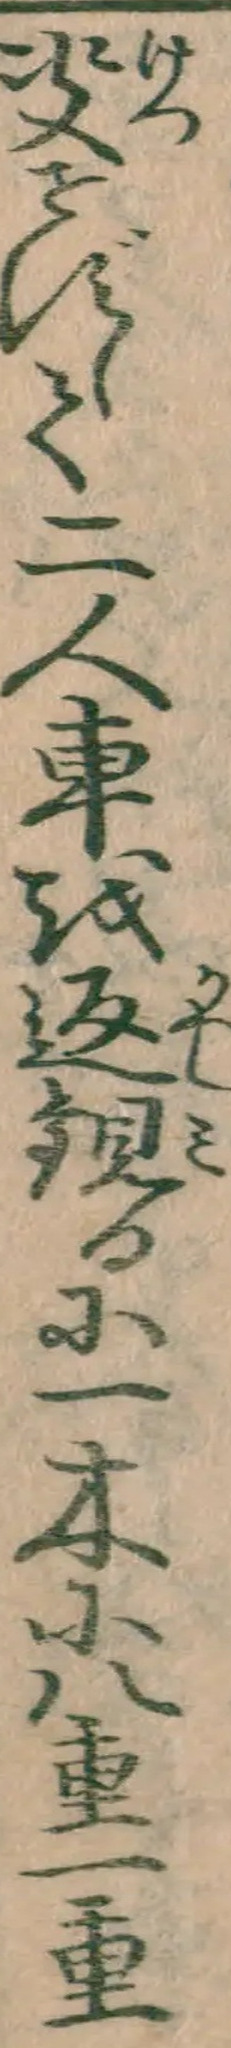決せずして二人車を返観るに一木に八重一重

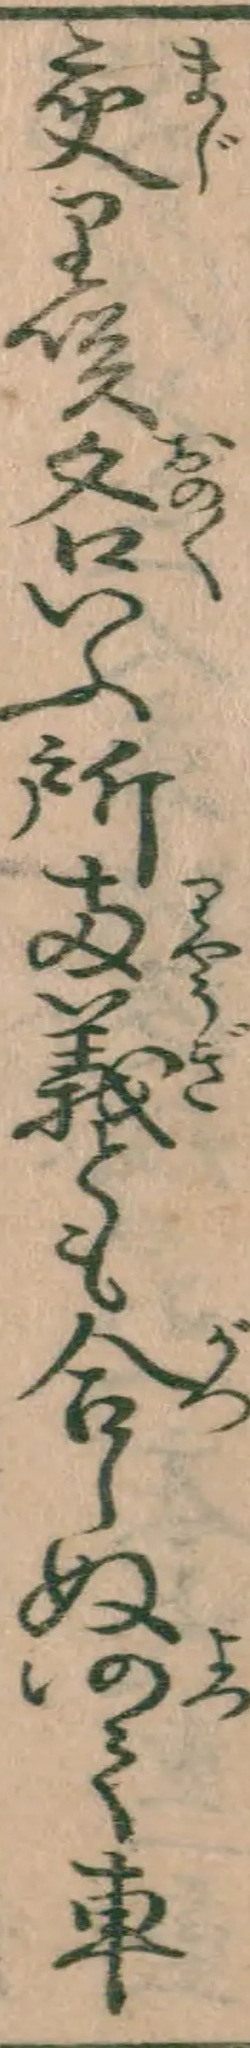交り咲各いふ所両義とも合しぬ仍て車
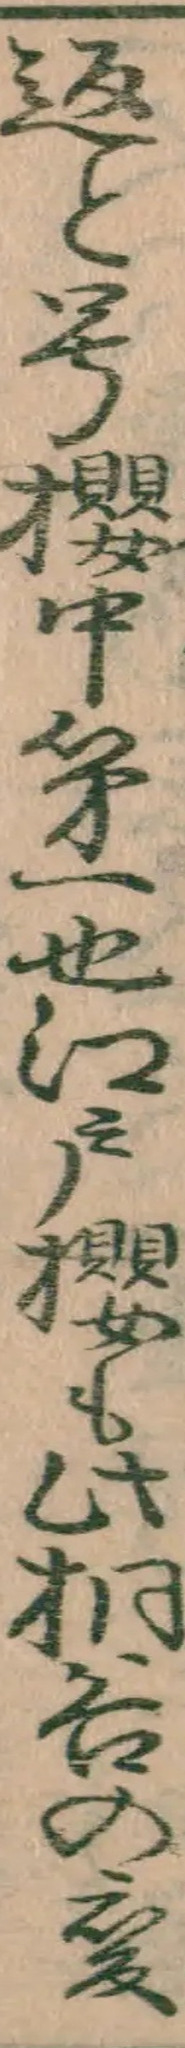返と号桜中第一也江戸桜も此桐谷の変
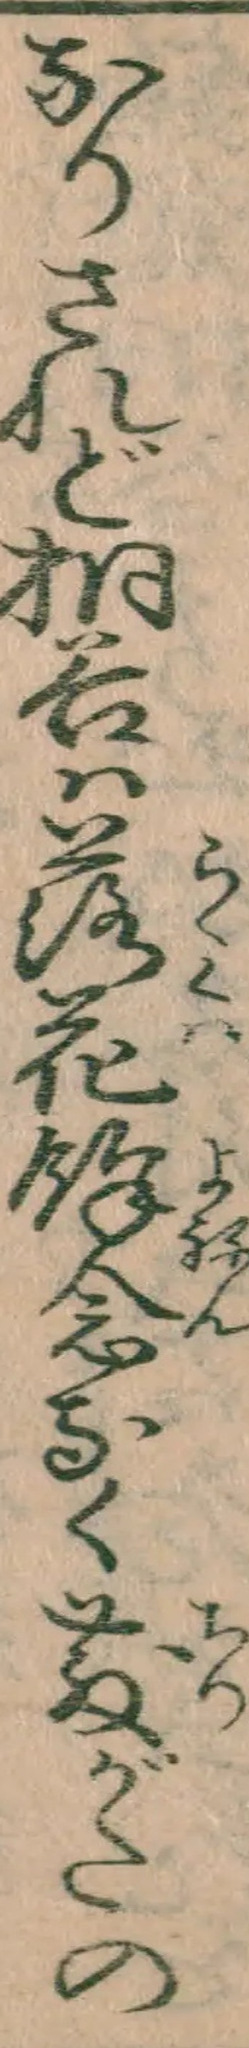なりされど桐谷は落花余念なく散がたの
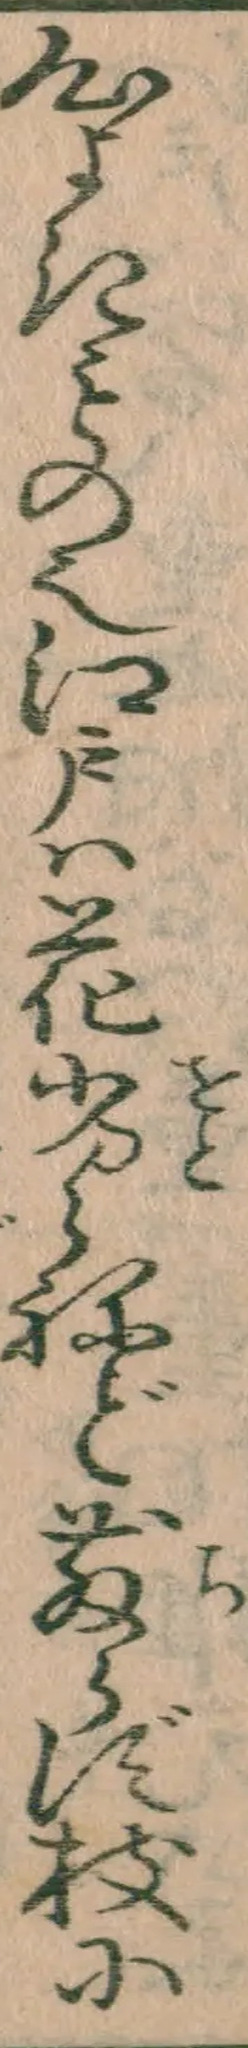心よきもの也江戸は花劣らねど散らず枝に
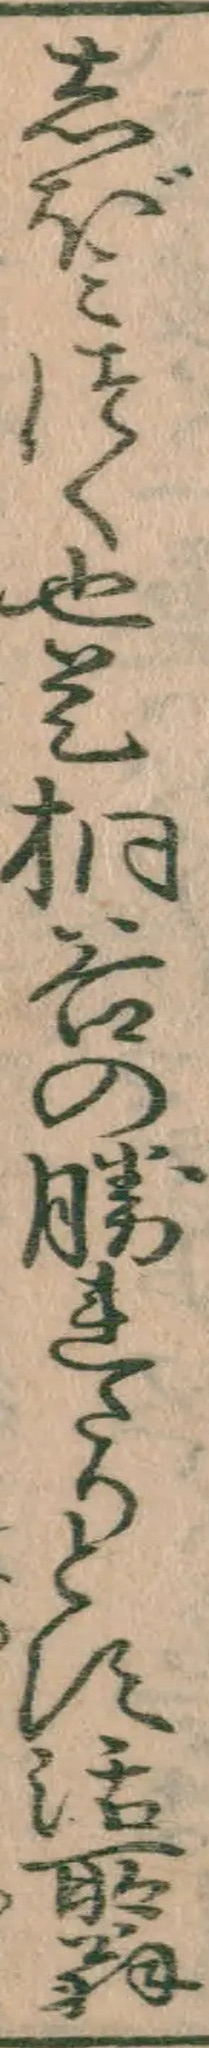しぼみつく也是桐谷の勝れたりとす活所翁
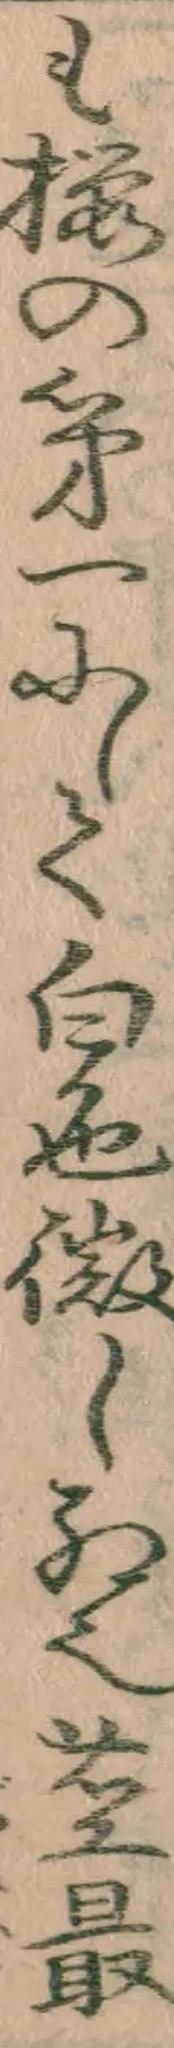も桜の第一にして白色微し紅也茎最
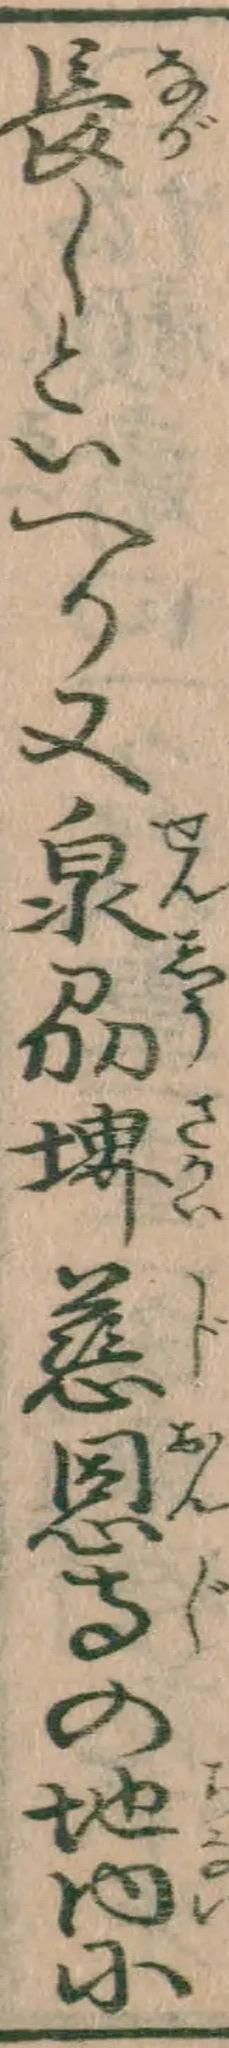長しといへり又泉州堺慈恩寺の地内に
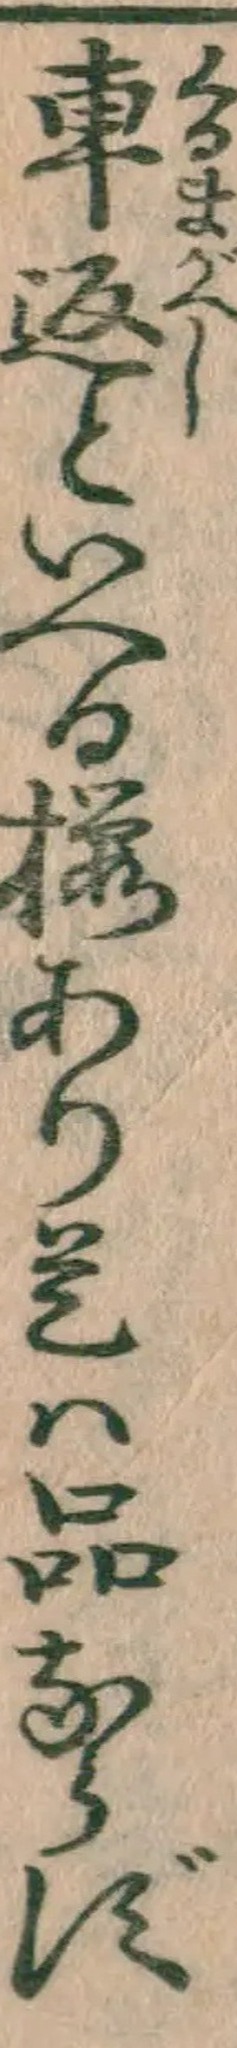車返といへる桜あり是は品ならず
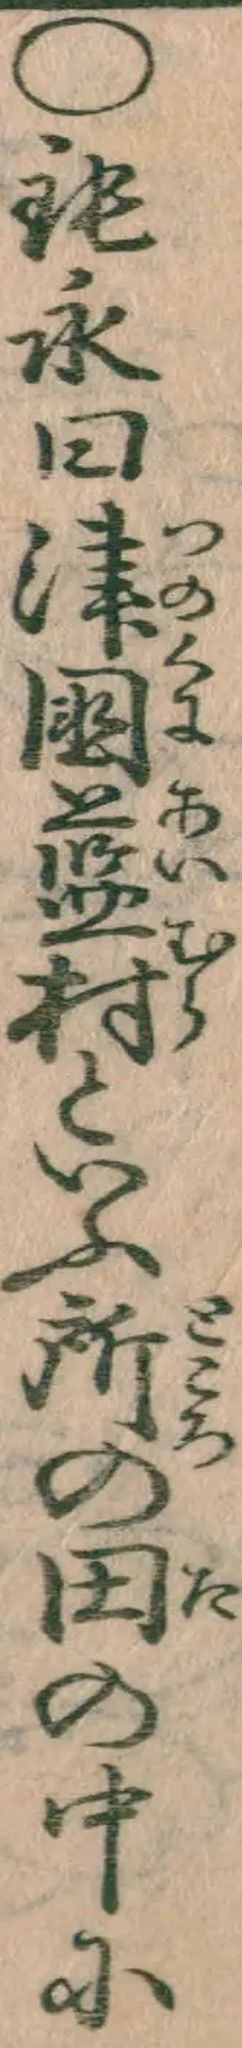○鈍永曰津国藍村といふ所の田の中に
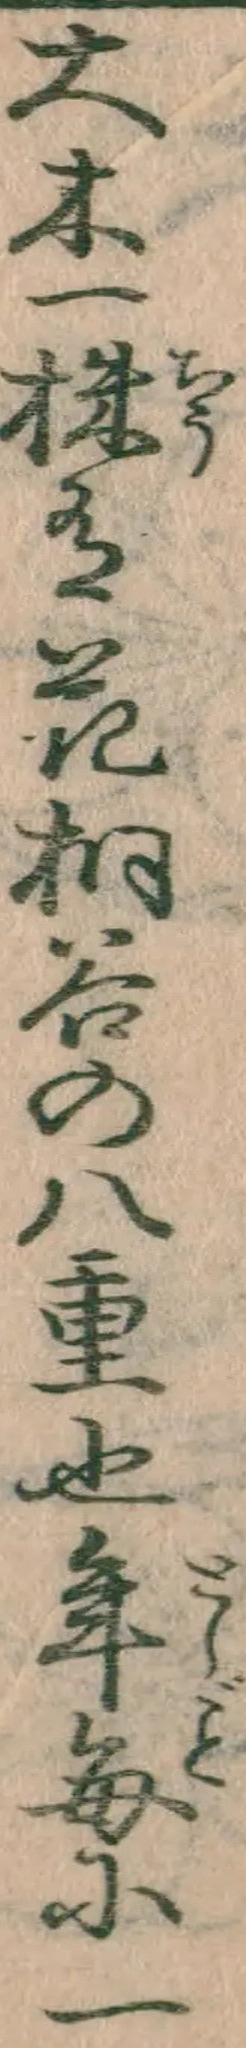大木一株有花桐谷の八重也年毎に一
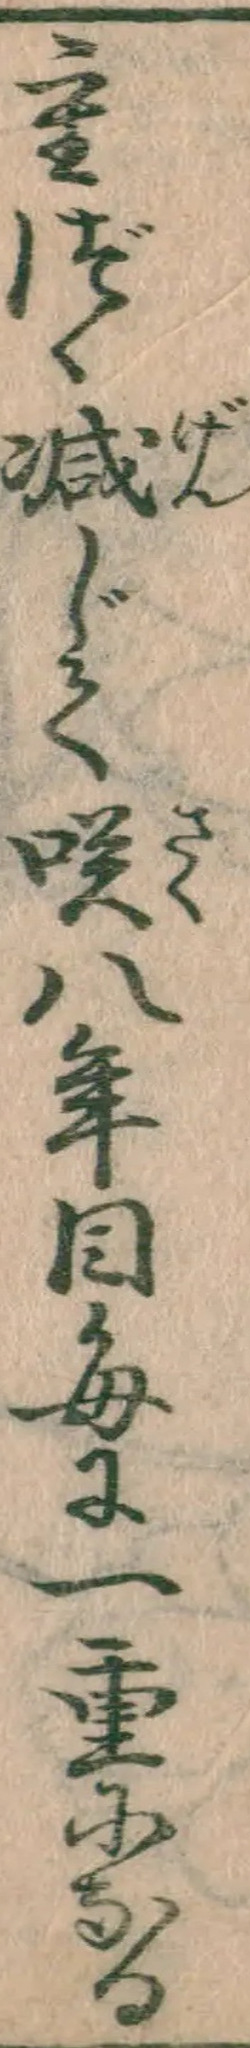重づゝ減じて咲八年目毎に一重になる
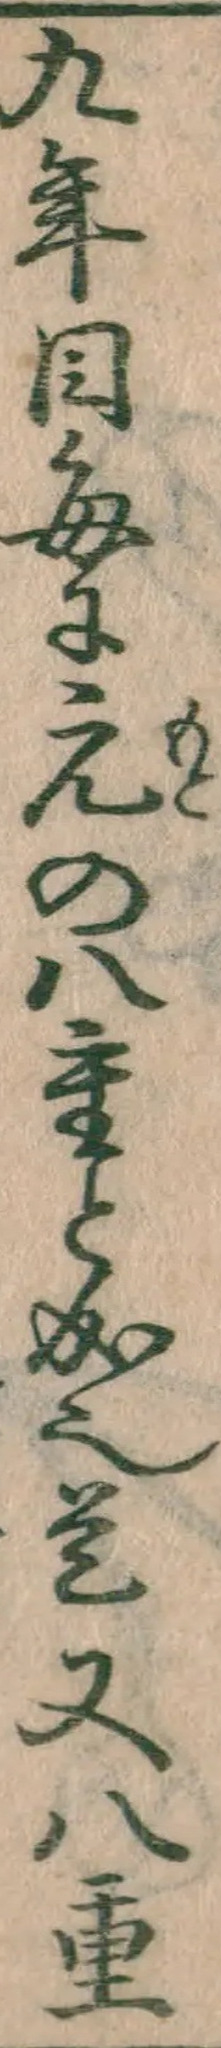九年目毎に元の八重と成也是又八重
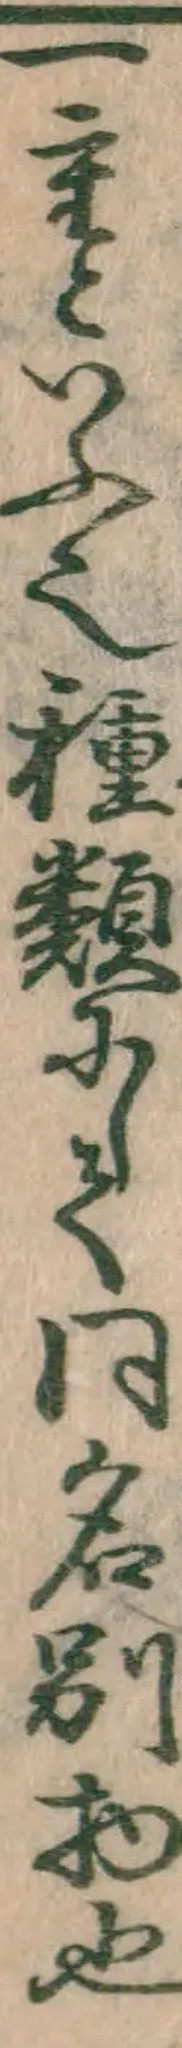一重といふ也種類にして同名別物也

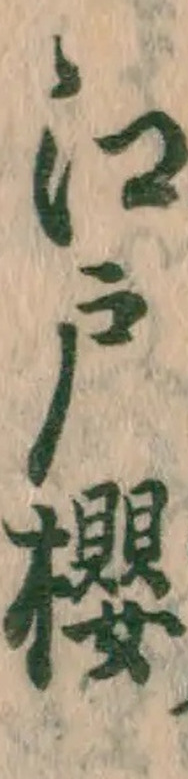江戸桜
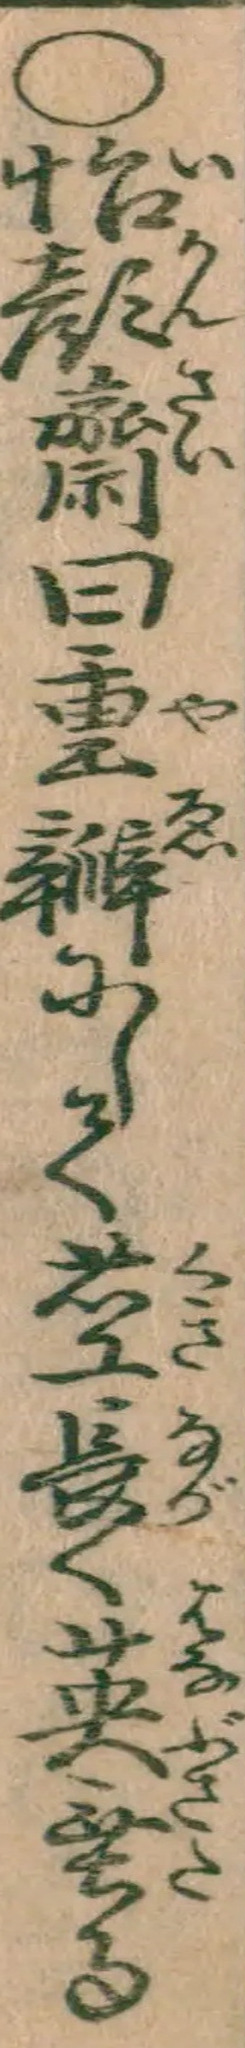○怡顔斎曰重弁にして茎長く英垂る
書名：怡顔齋櫻品
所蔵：国立国会図書館 National Diet Library, JAPAN
